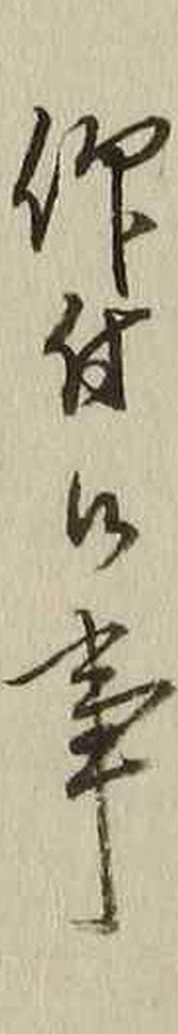仰付候事
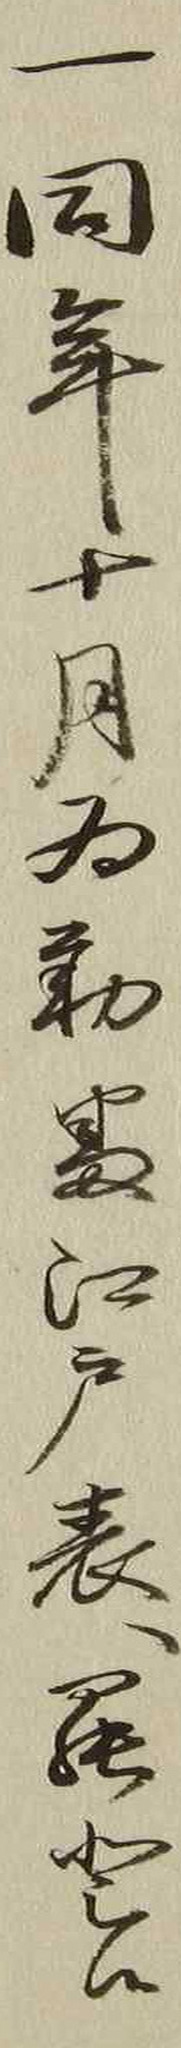一同年十月為勤番江戸表へ罷登候
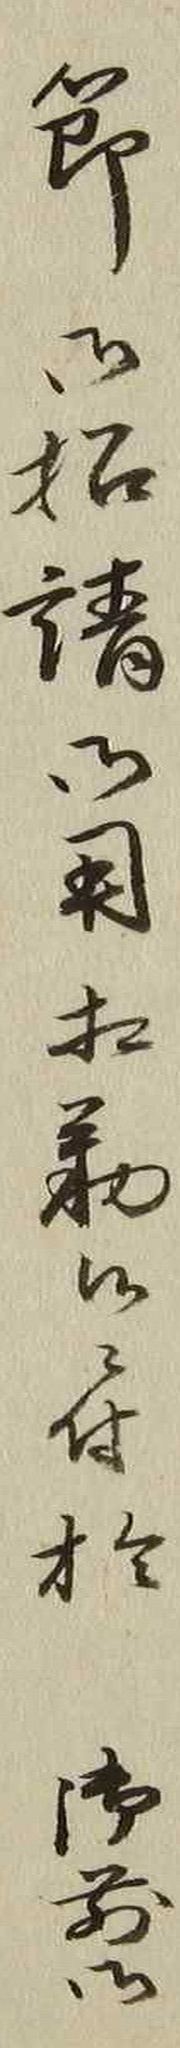節御招請御用相勤候に付於御前御
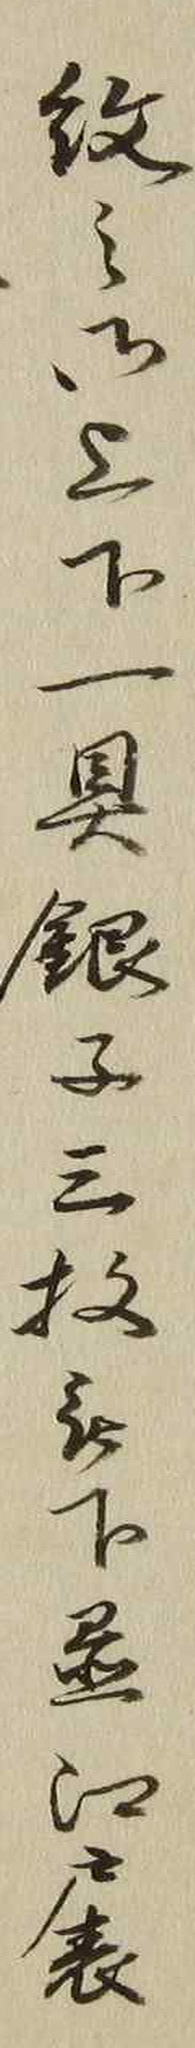紋之御上下一具銀子三枚被下置江戸表
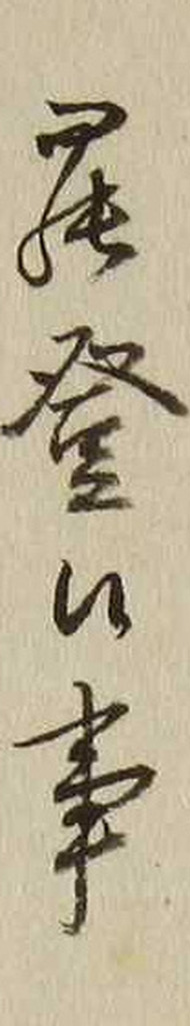罷登候事
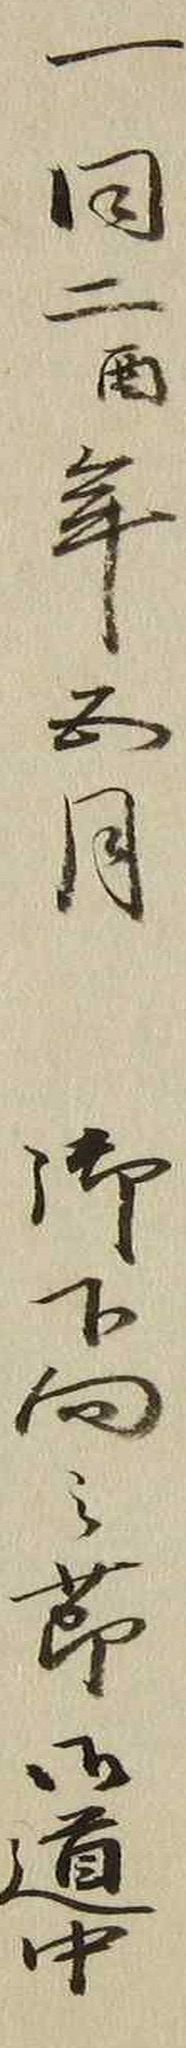一同二酉年五月御下向之節御道中
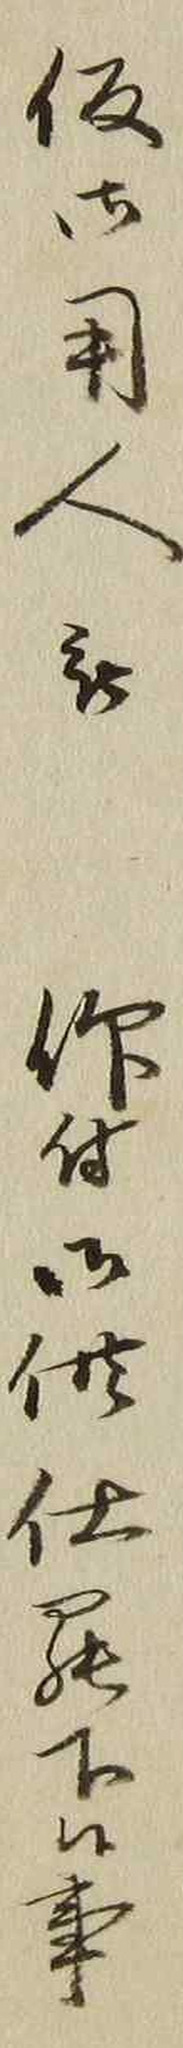仮御用人被仰付御供仕罷下候事
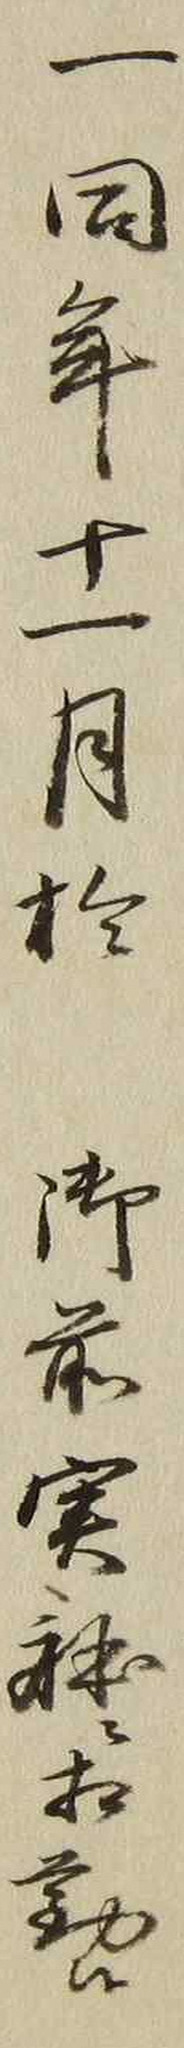一同年十一月於御前実体に相勤候
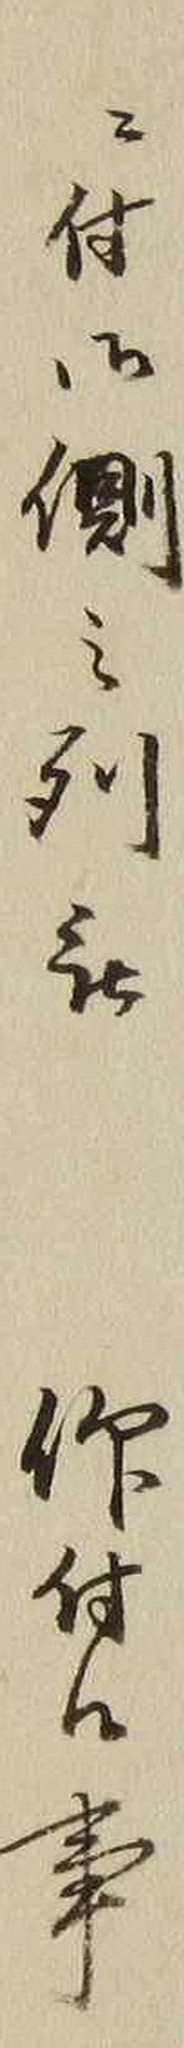に付御側之列被仰付候事
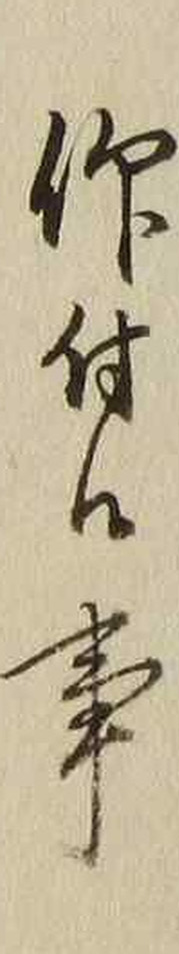仰付候事
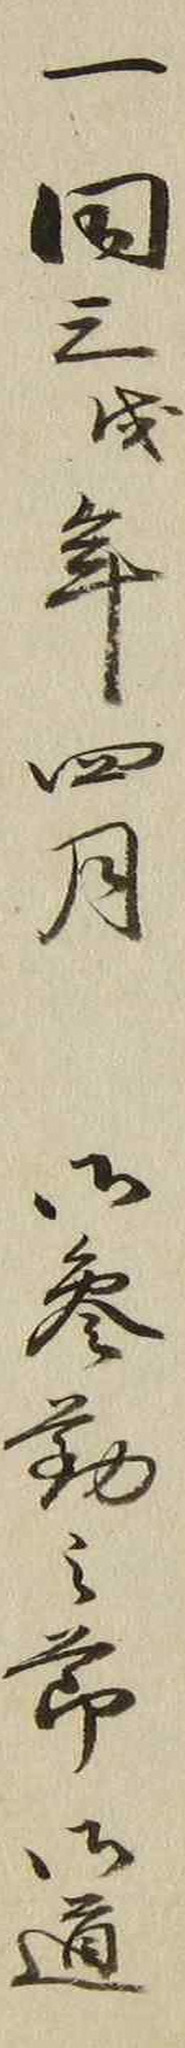一同三戌年四月御参勤之節御道
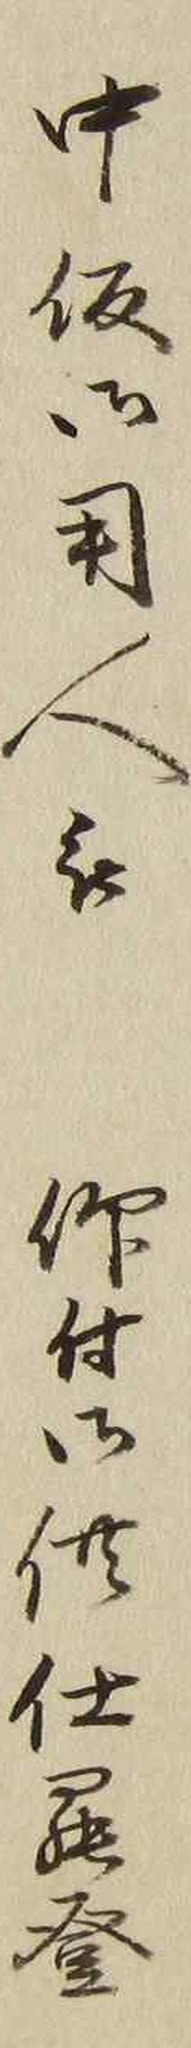中仮御用人被仰付御供仕罷登
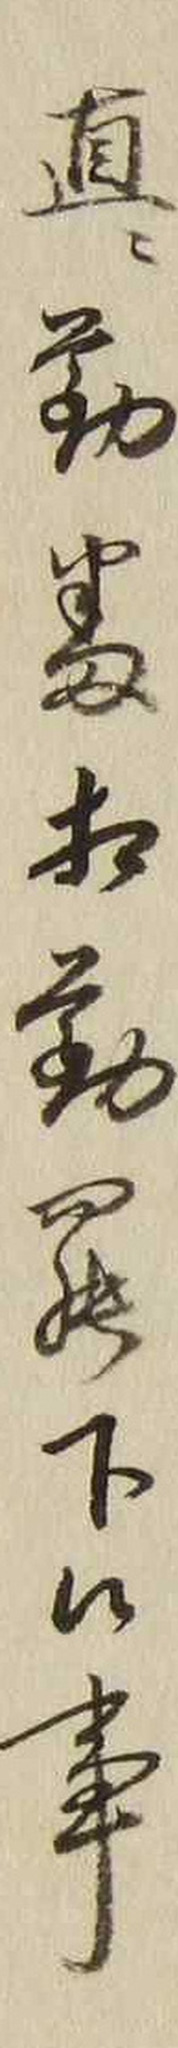直に勤番相勤罷下候事
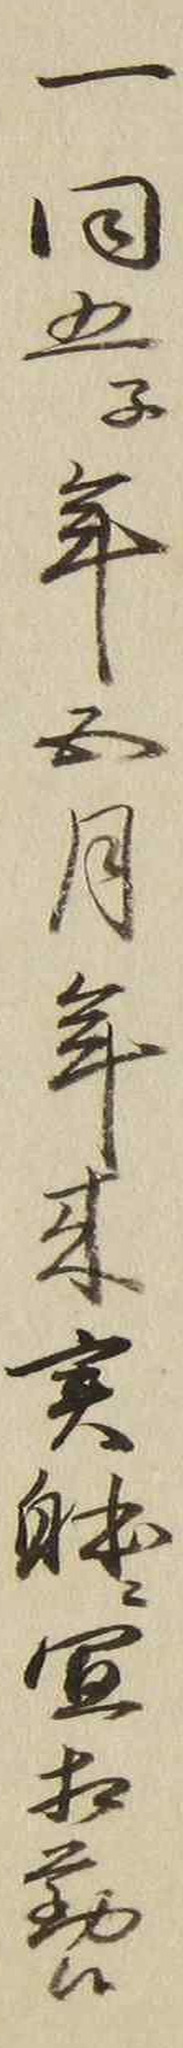一同五子年五月年来実体に宜相勤候

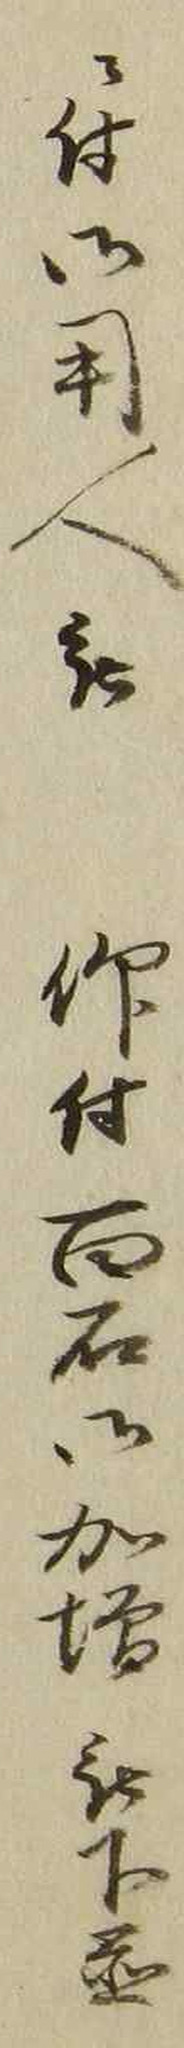に付御用人被仰付百石御加増被下置
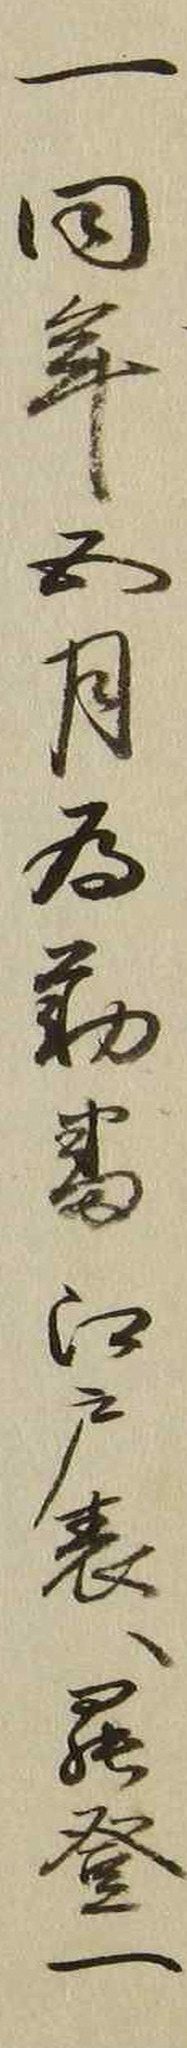一同年五月為勤番江戸表へ罷登一
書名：諸士系譜　巻之133　た之部9
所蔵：会津若松市立会津図書館
